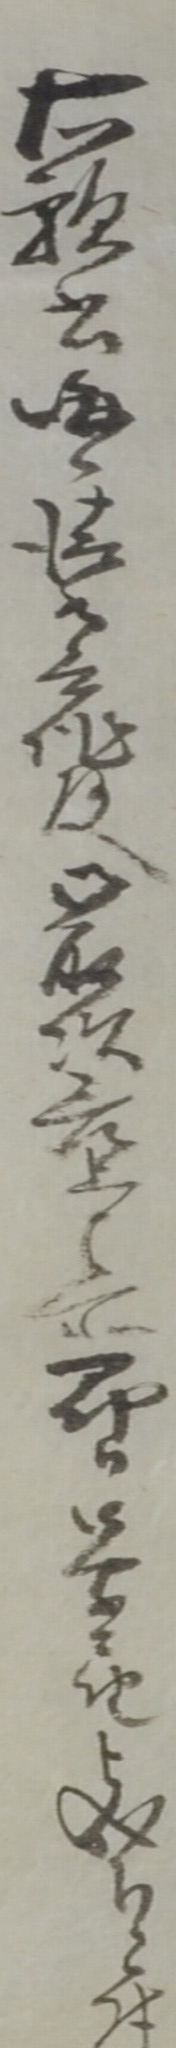右願書晦日清水兵作殿御取次差上申候所即日御聞御届被成下候ニ付
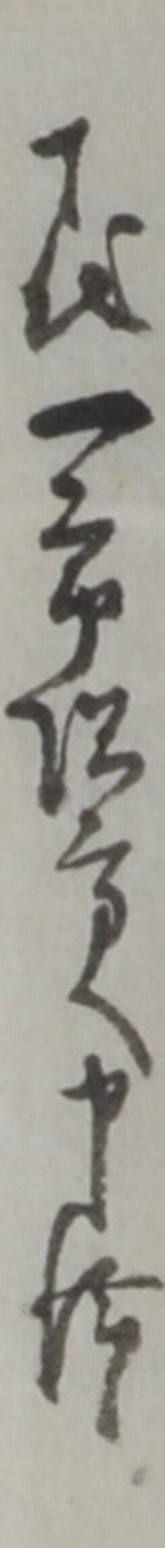丁代一郎次方へ申渡候

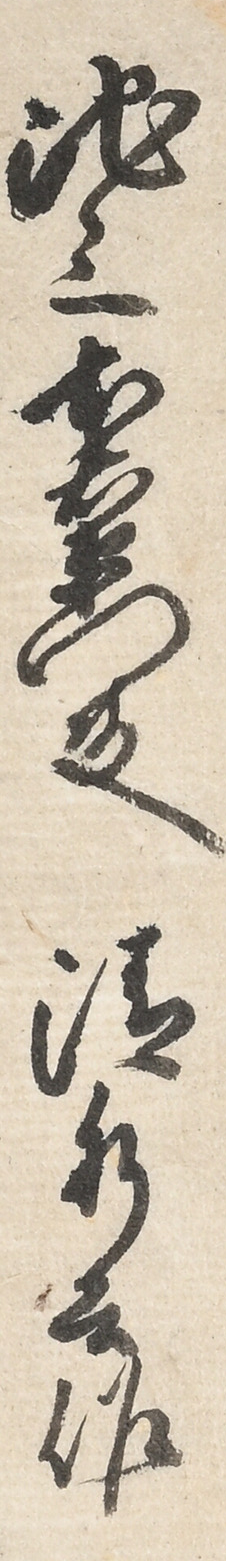池上本右衛門殿清水兵作

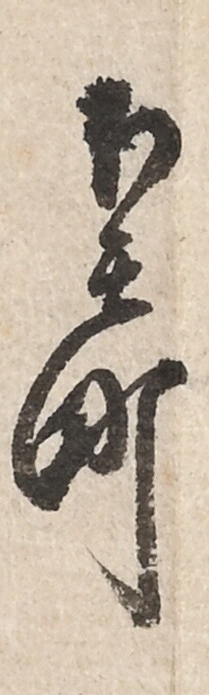下モ町
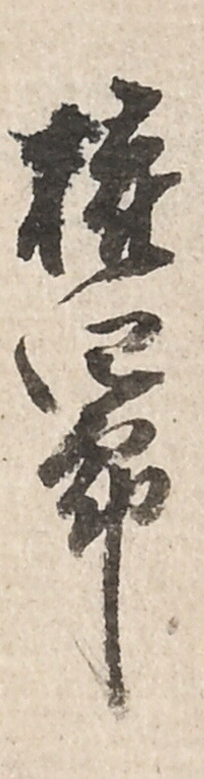権四郎
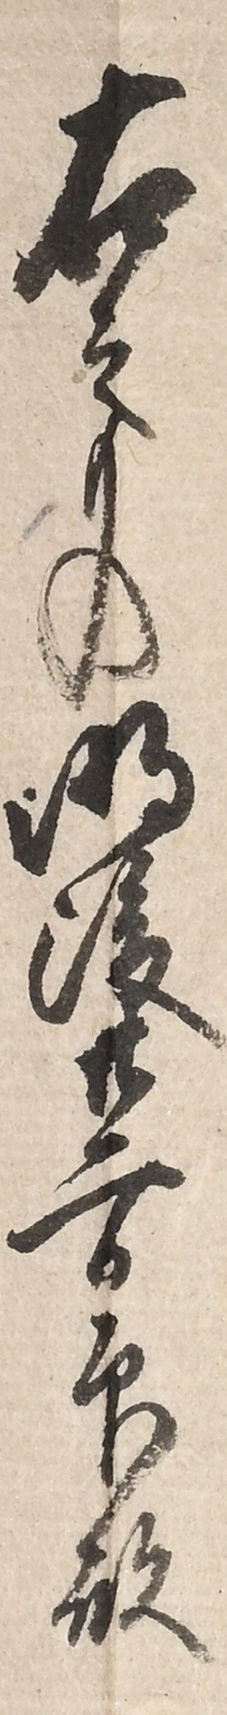右之もの明後廿ニ日印形
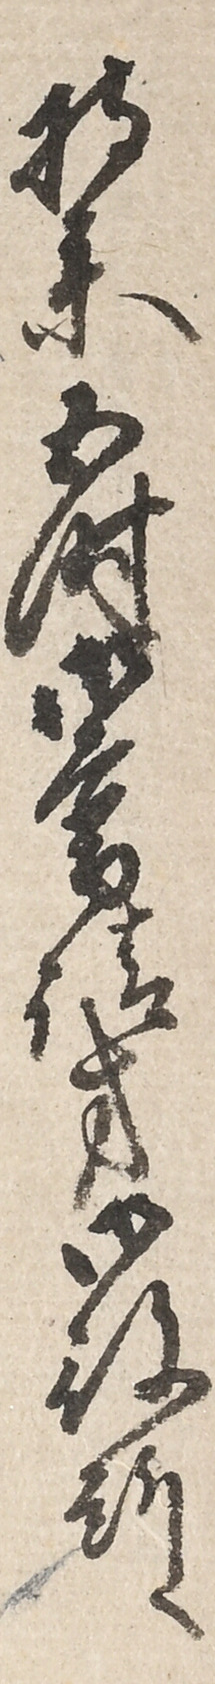持参五時御普請方御役所へ
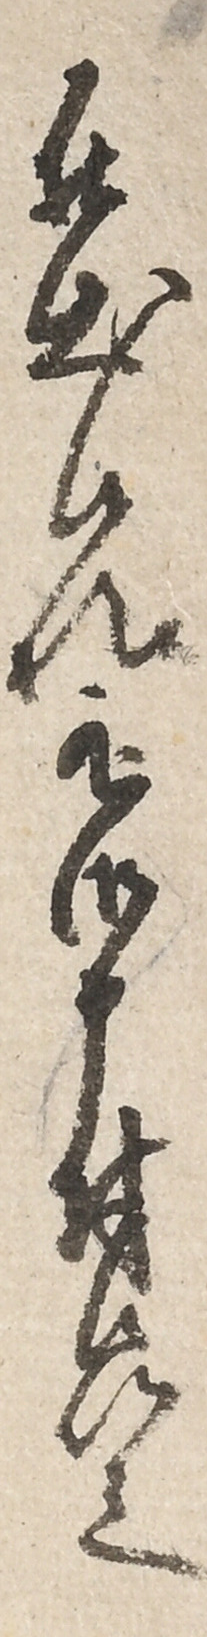罷出候様可御申付候以上
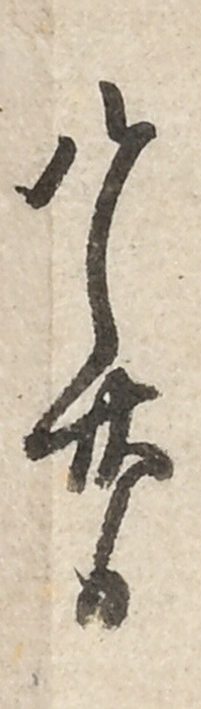八月廿日

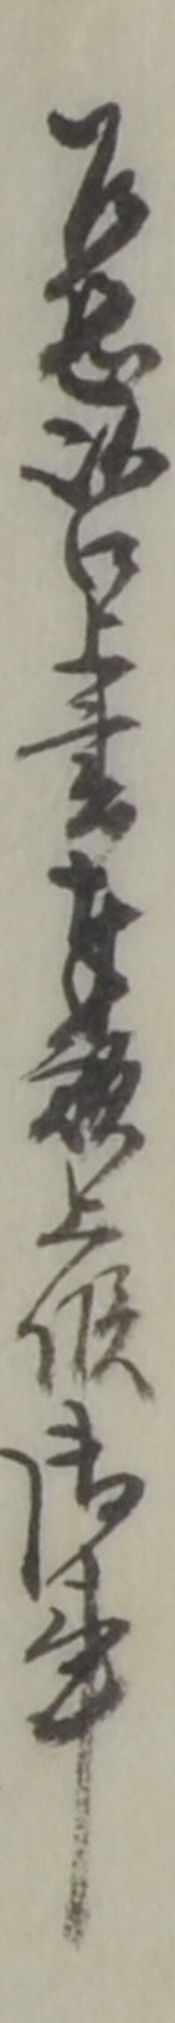乍恐以口上書奉願上候御事
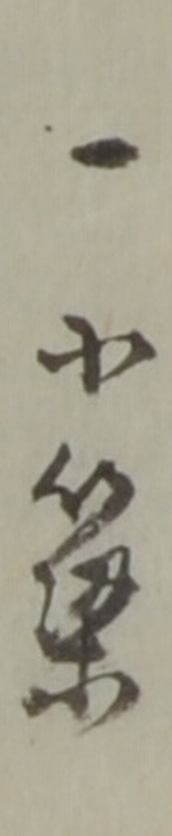一小簗
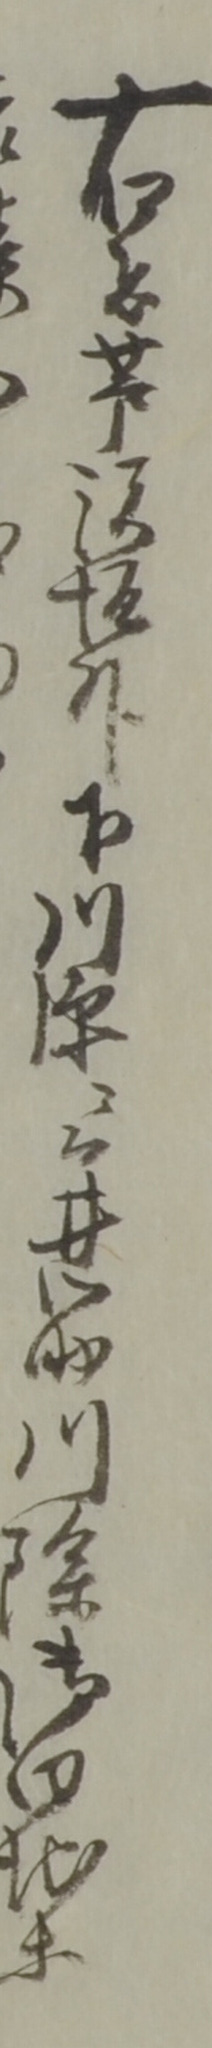右者芦沢坂外下川原ニ而井筋川除御田地等
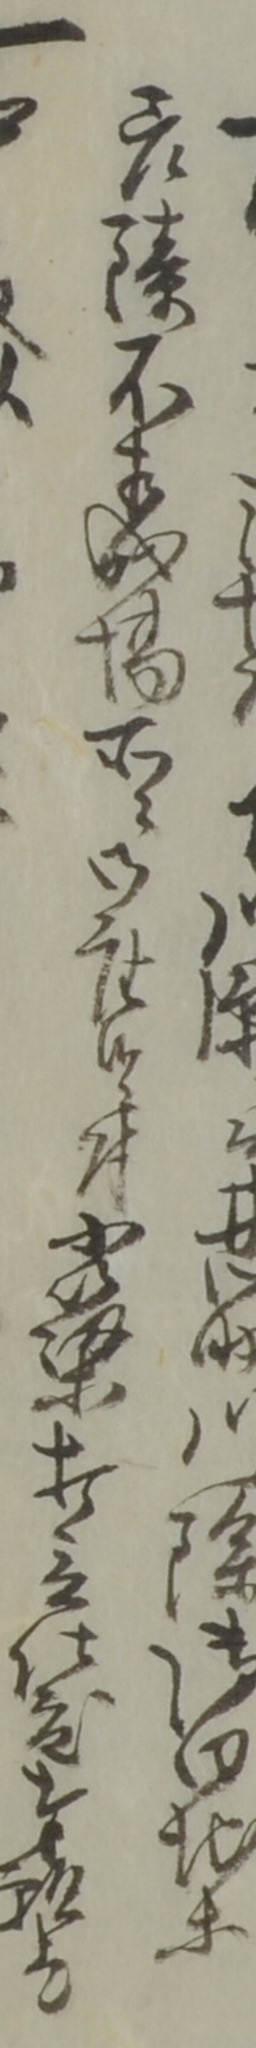差障不相成場所ニ御座候ニ付小簗打立仕度奉願上候
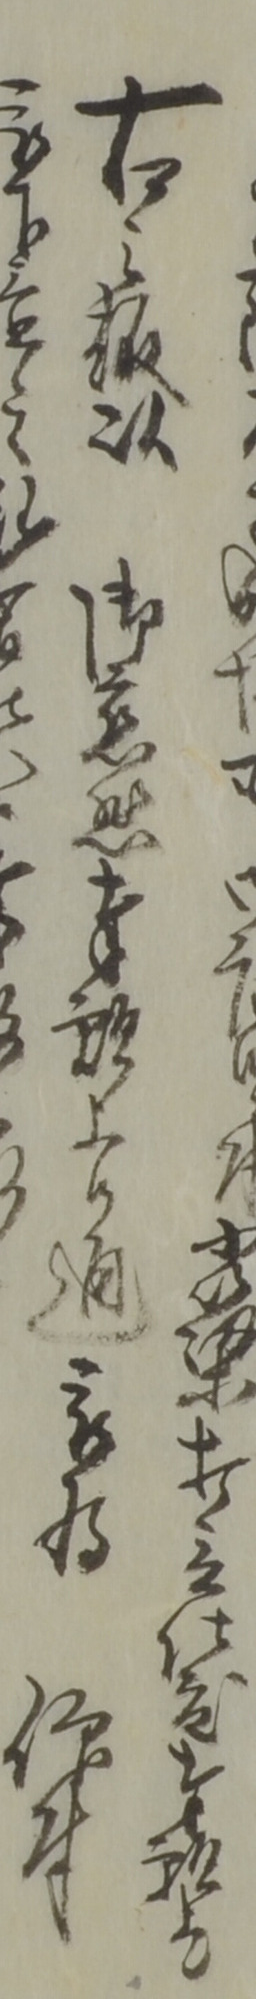右之趣以御慈悲奉願上候通被為仰付
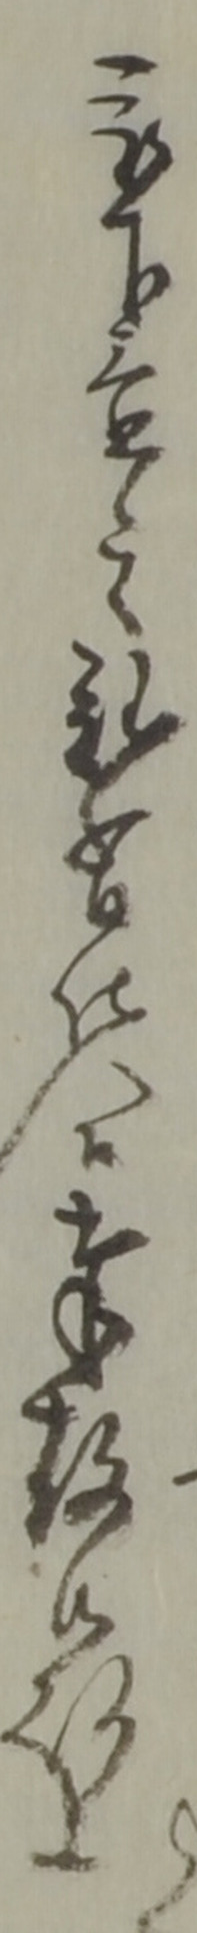被下置候ハヽ難有仕合奉存候以上
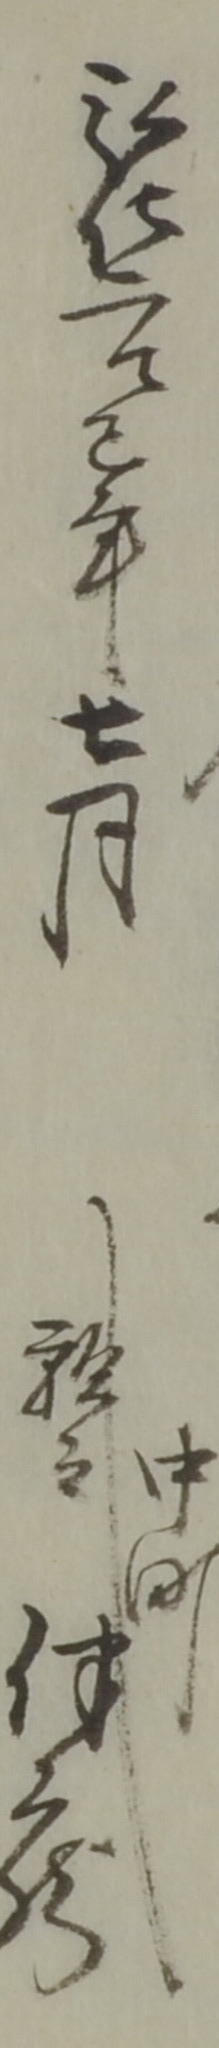弘化二乙巳年七月願主伴蔵
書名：諸願書控簿
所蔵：伊那市立高遠町図書館・合同会社AMANE
